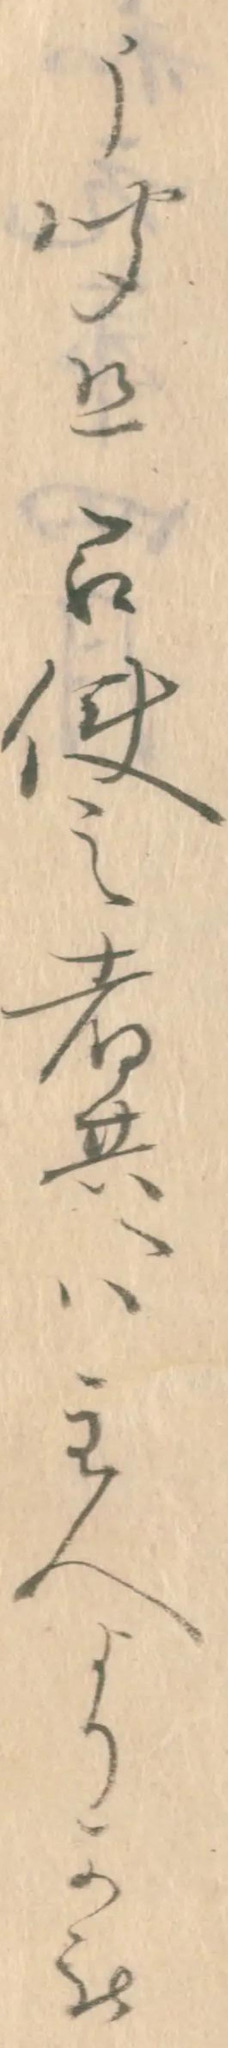申聞且召使之者共へは主人より可被
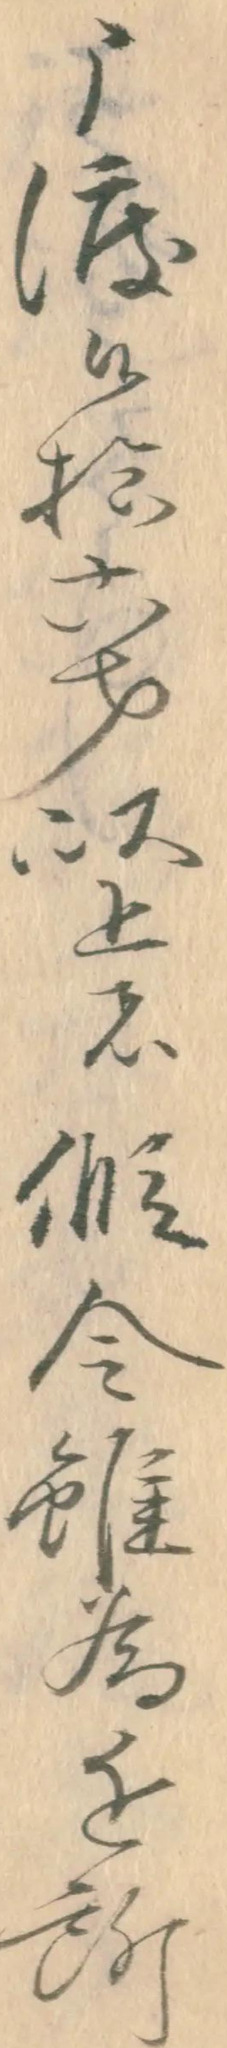申渡候拾六才以上は仮令雖為近所
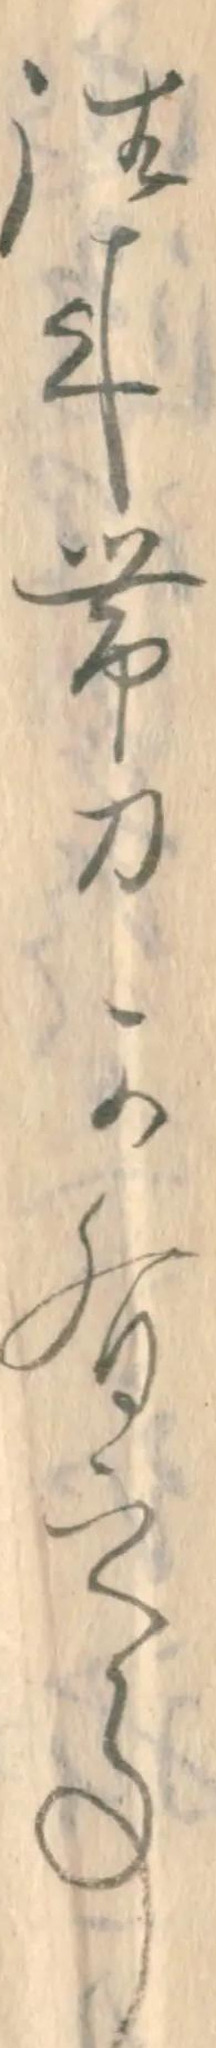往来帯刀可有之事
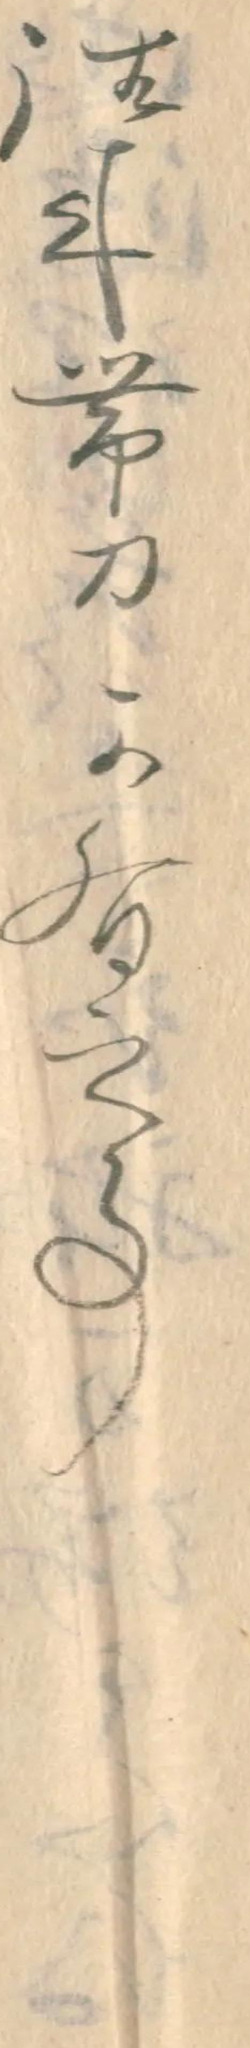往来帯刀可有之事
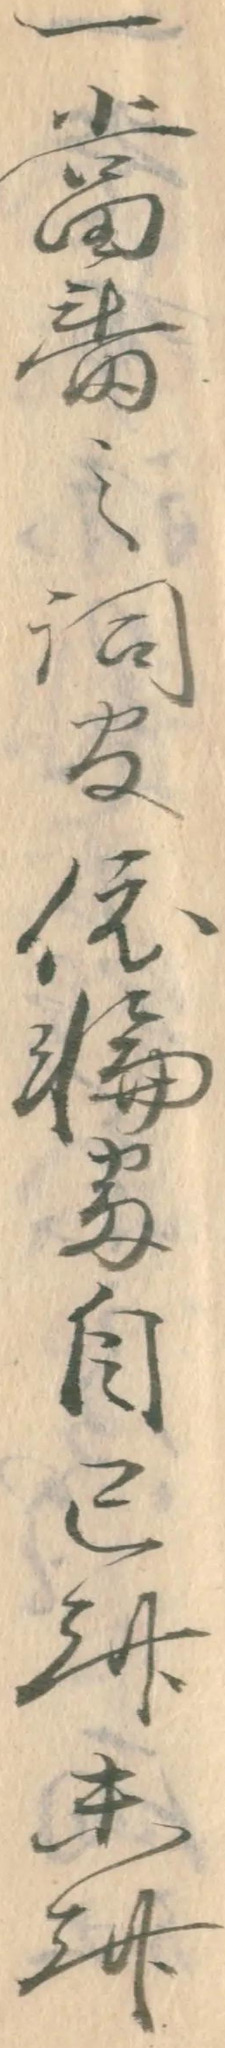一当番之詞官依輪番自巳刻未刻
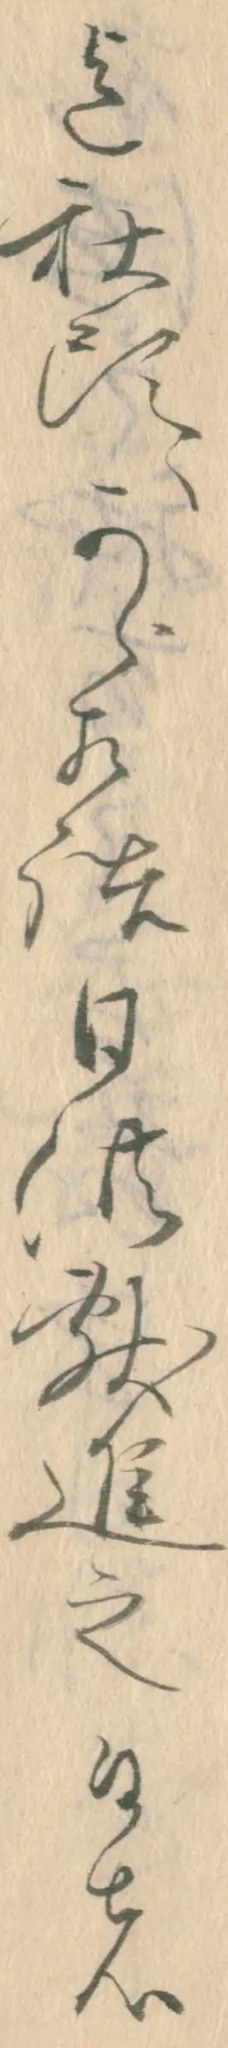迄社頭へ可被相詰日供献進之日は
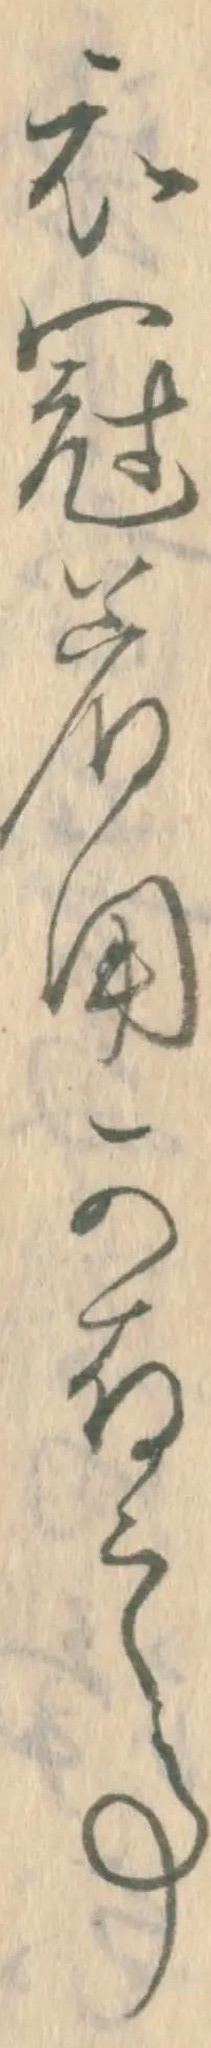衣冠着用可有之事
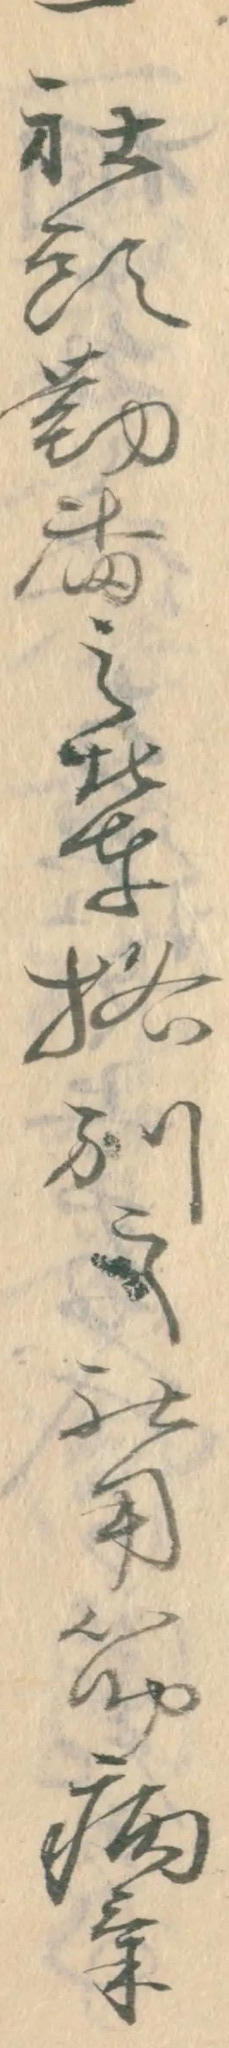一社頭勤番之輩格別之社用筋病気
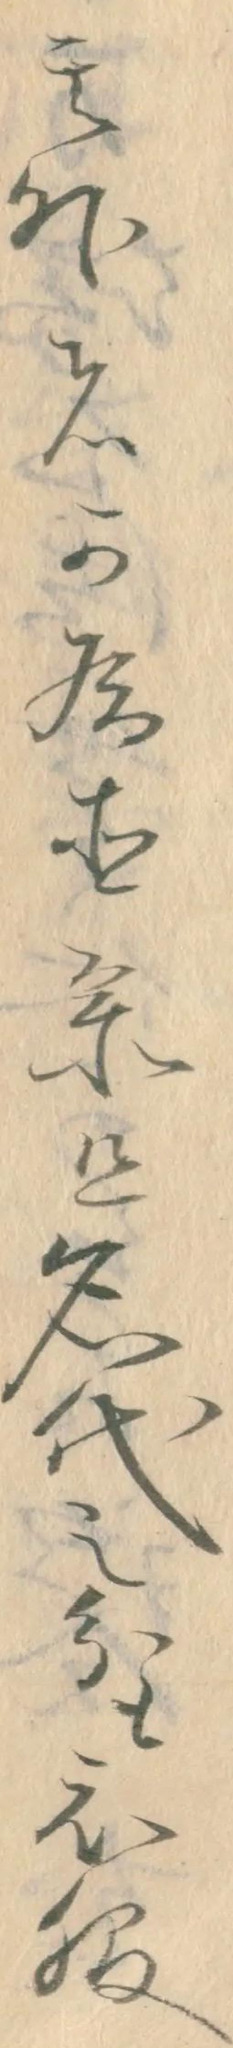其外は可為直参且名代之分も衣服

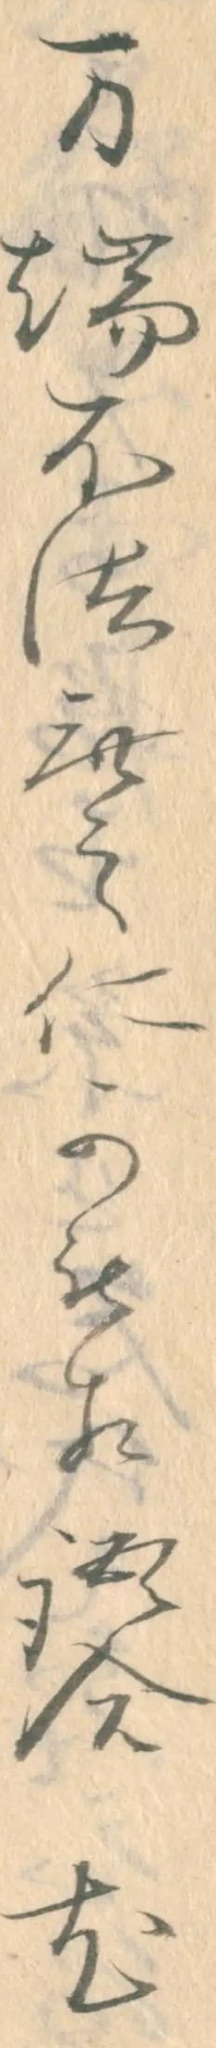万端不法無之仁可被相語合尤
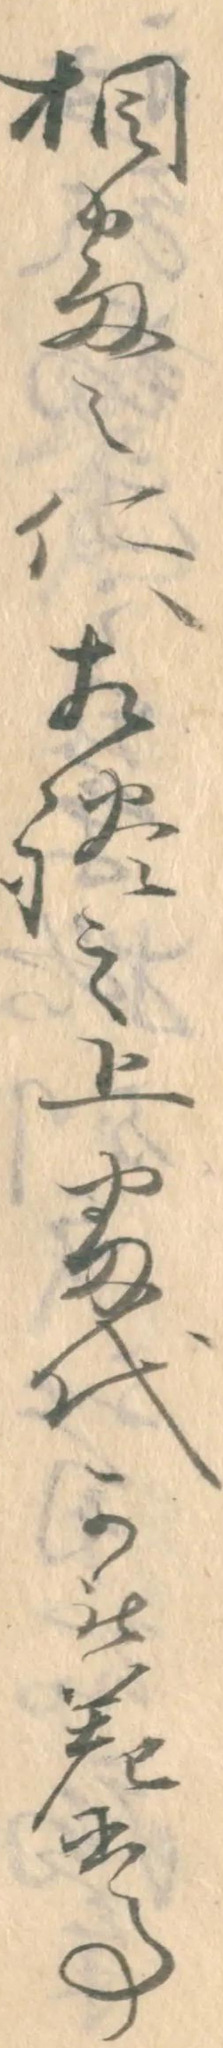相番之仁へ相談之上番代可被差出事
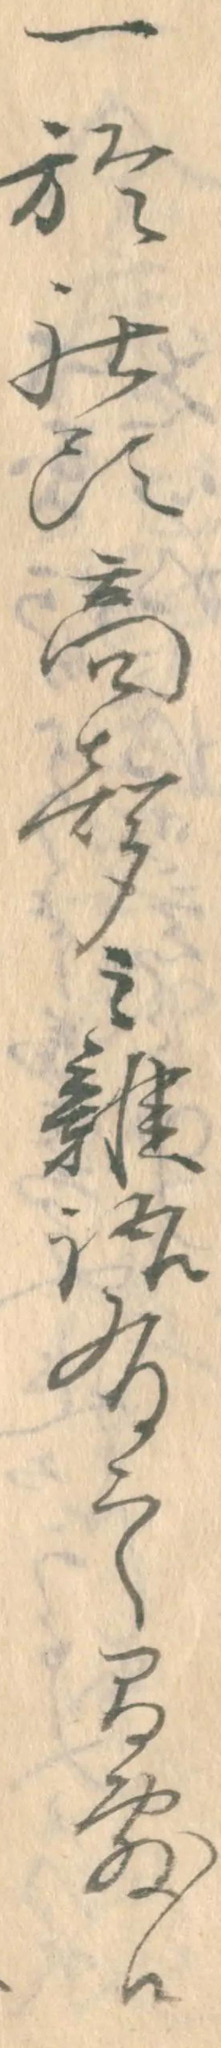一於社頭高声之雑語有之間敷候
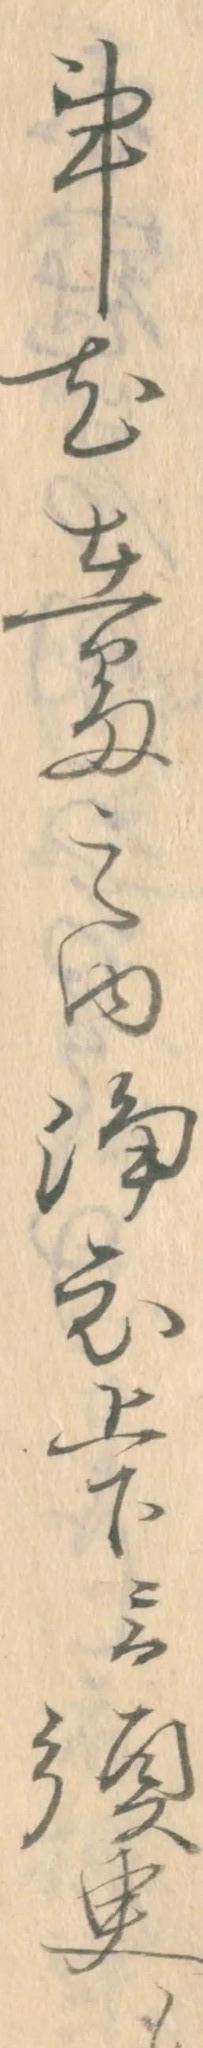事尤在番之内浄衣上下に而須臾も
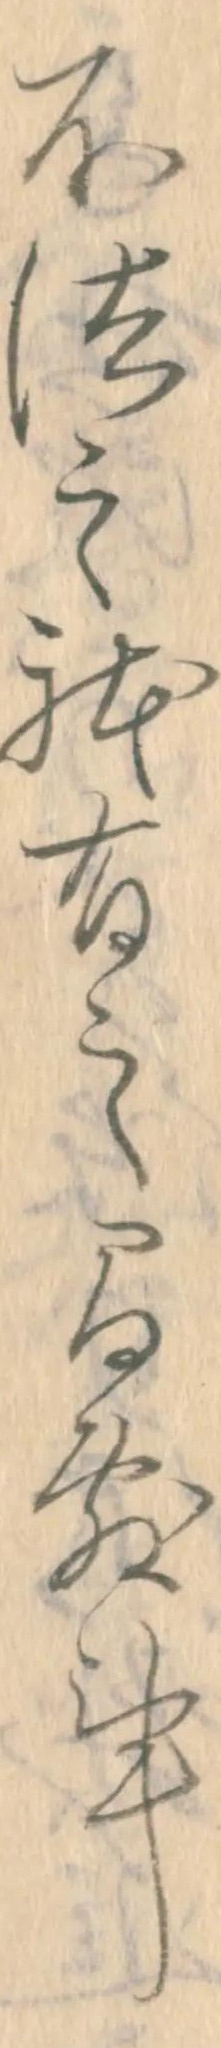不法之躰有之間敷事
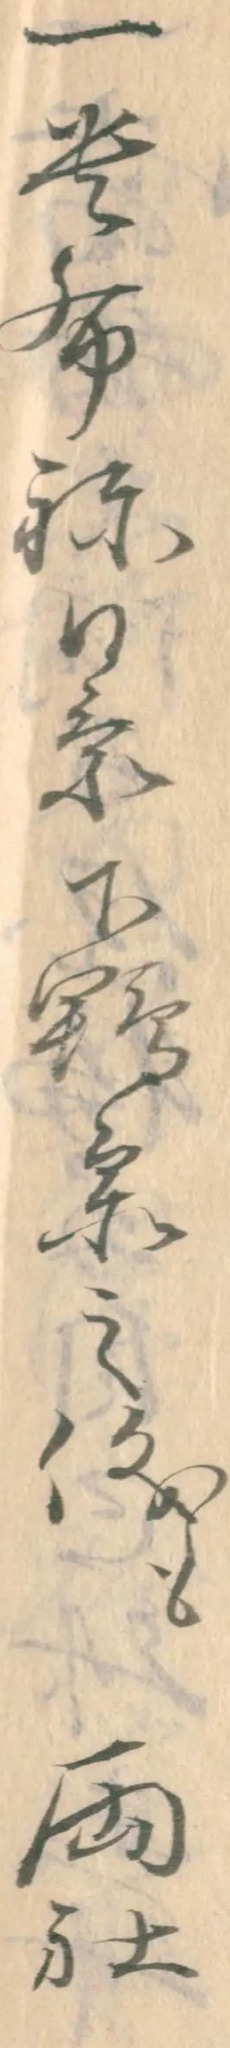一貴布祢日参下鴨参之儀も両社
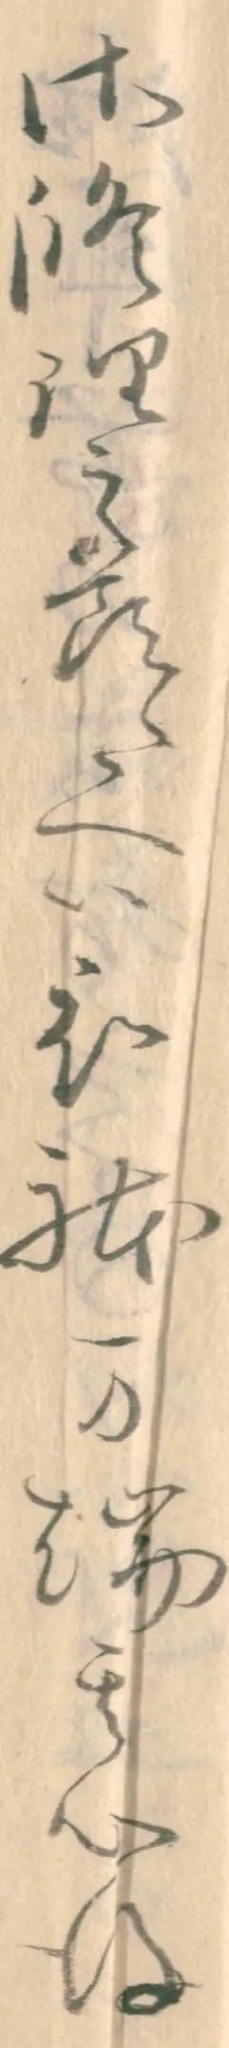御修理之節候へは衣躰万端其心得
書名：賀茂社記録. 第22冊
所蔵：国立国会図書館 National Diet Library, JAPAN
